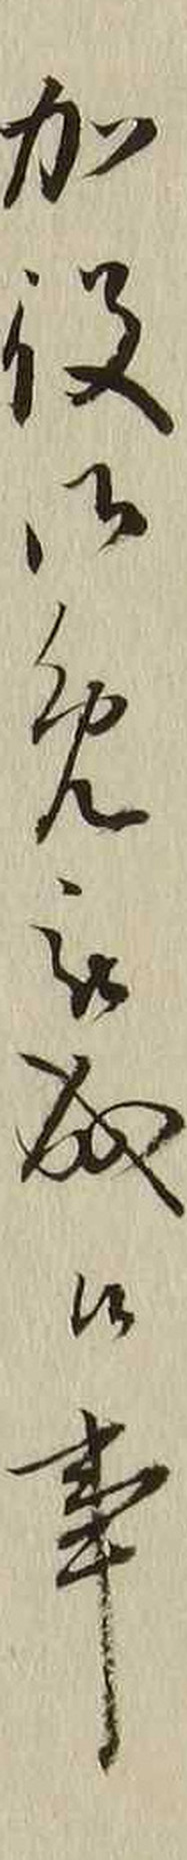加役御免被成候事
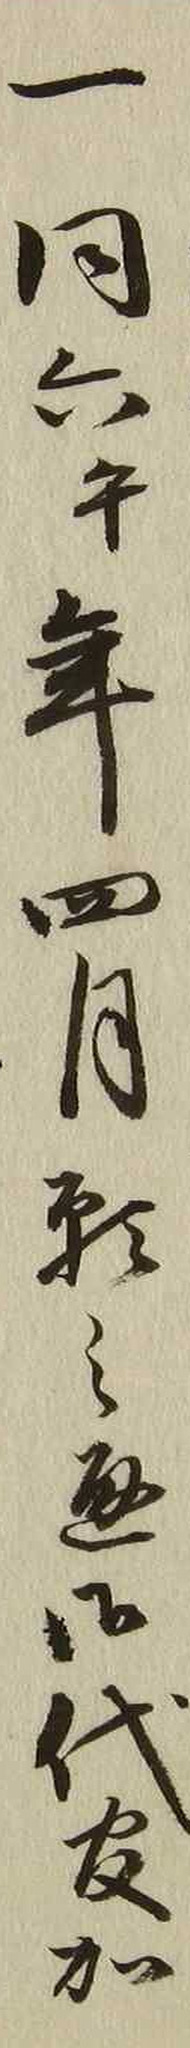一同六午年四月願之通御代官加
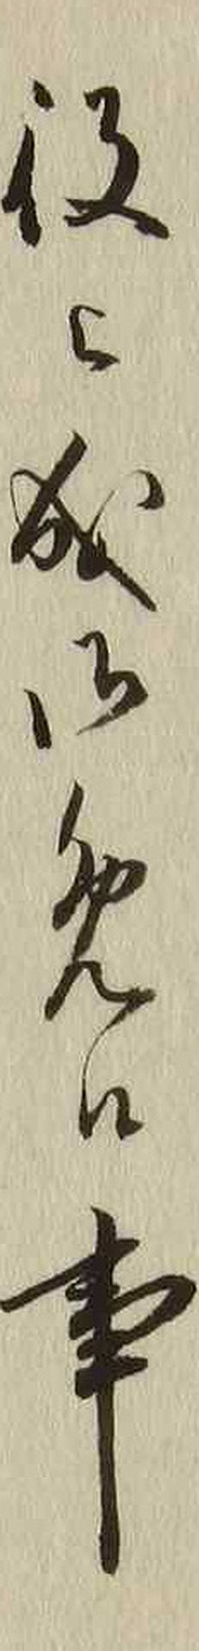役被成御免候事
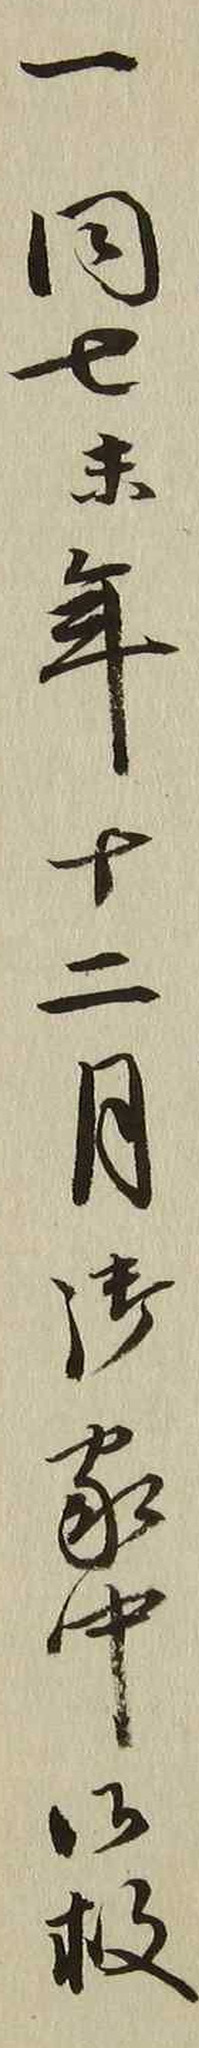一同七未年十二月御家中御救
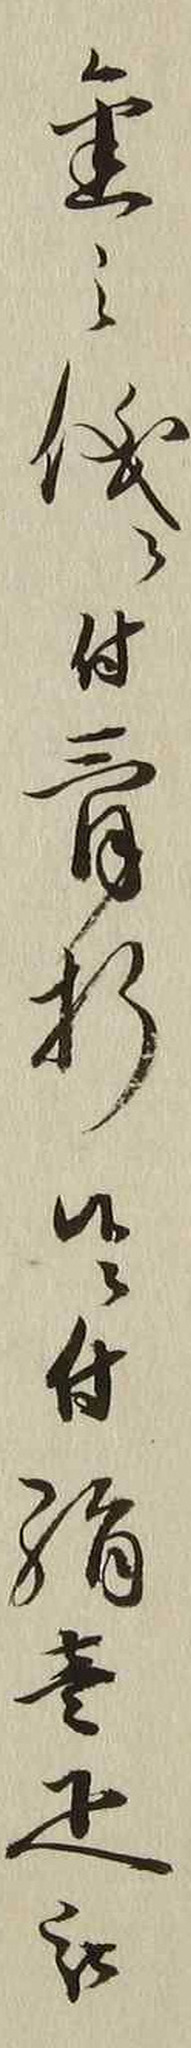金之儀ニ付骨折候ニ付絹壱疋被
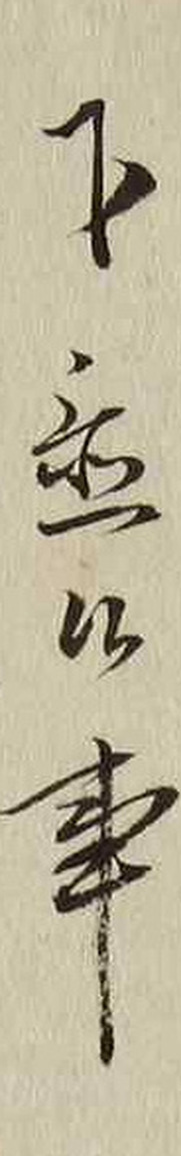下置候事
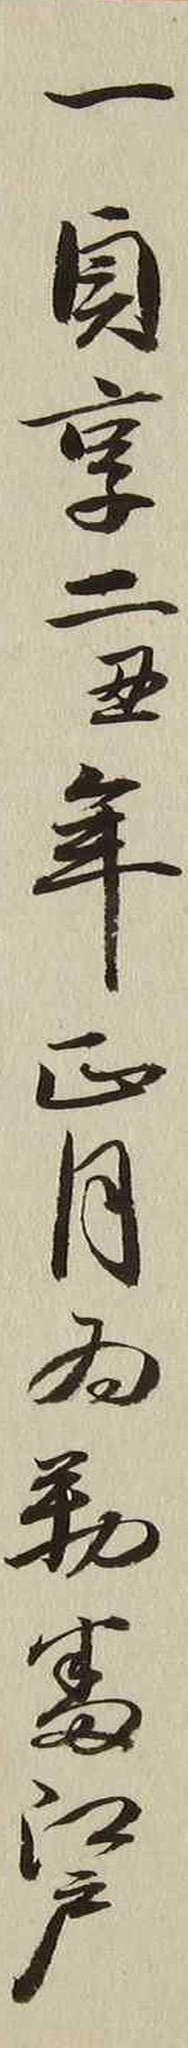一貞享二丑年正月為勤番江戸
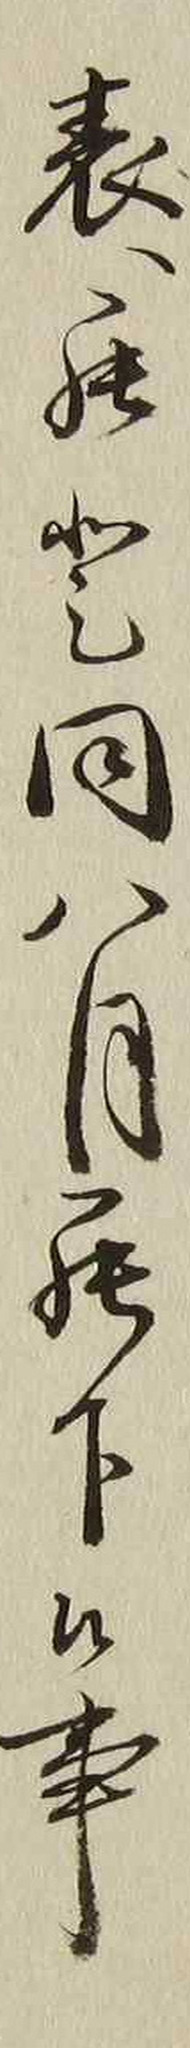表へ罷登同八月罷下候事
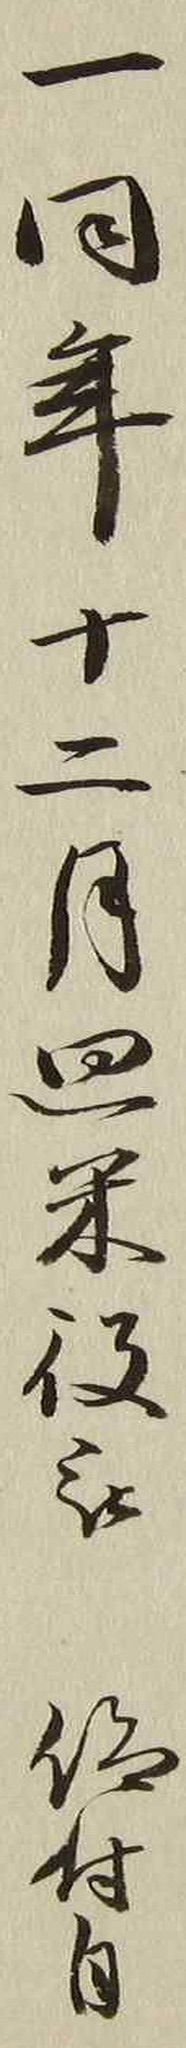一同年十二月廻米役被仰付自
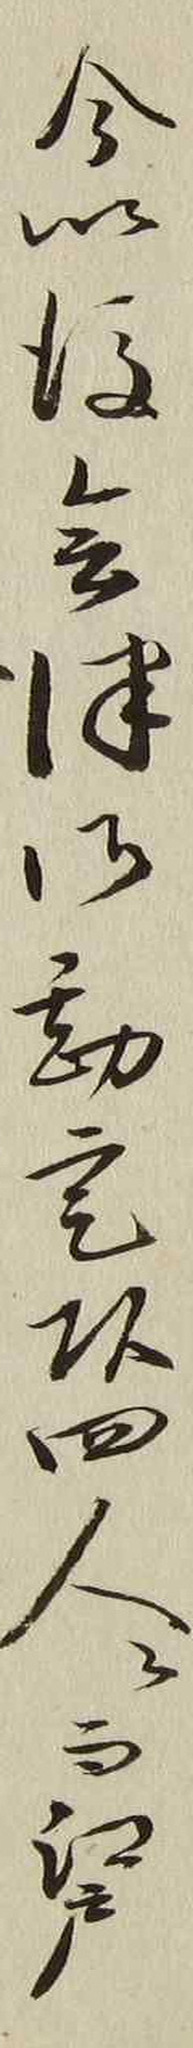今以後会津御勘定頭四人ニ而江戸
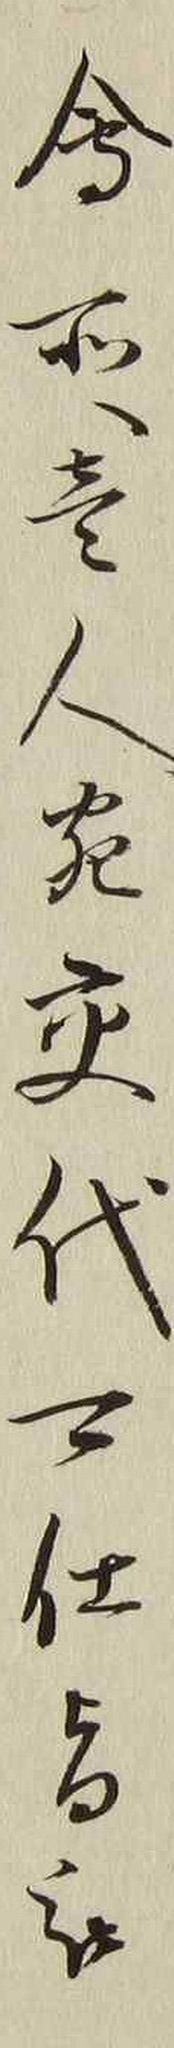会所へ壱人宛交代可仕旨被
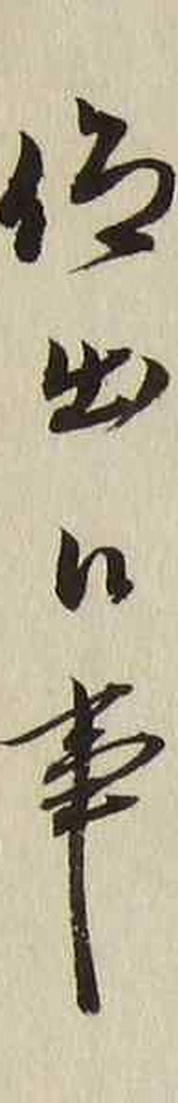仰出候事
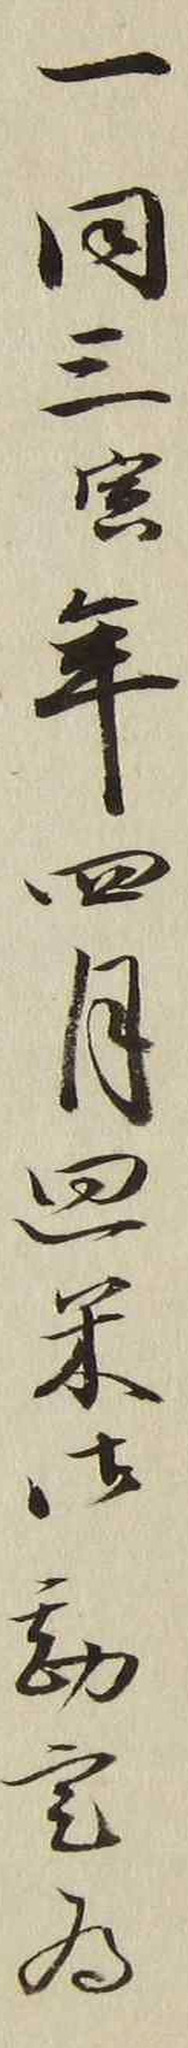一同三寅年四月廻米御勘定為
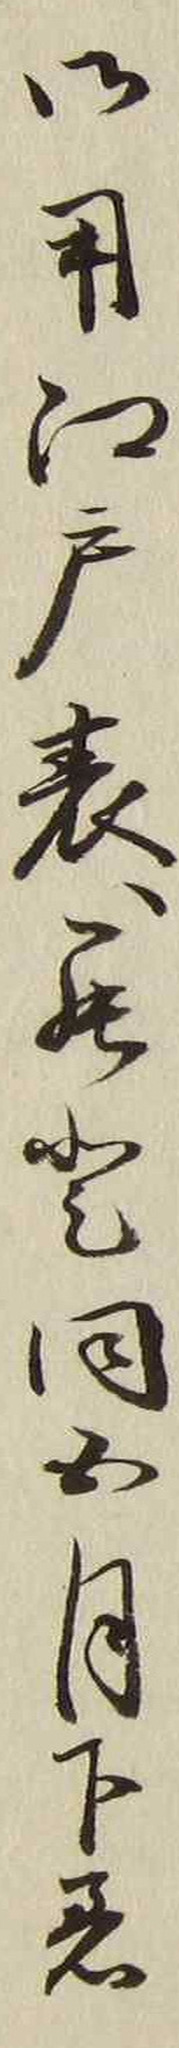御用江戸表へ罷登同五月下着

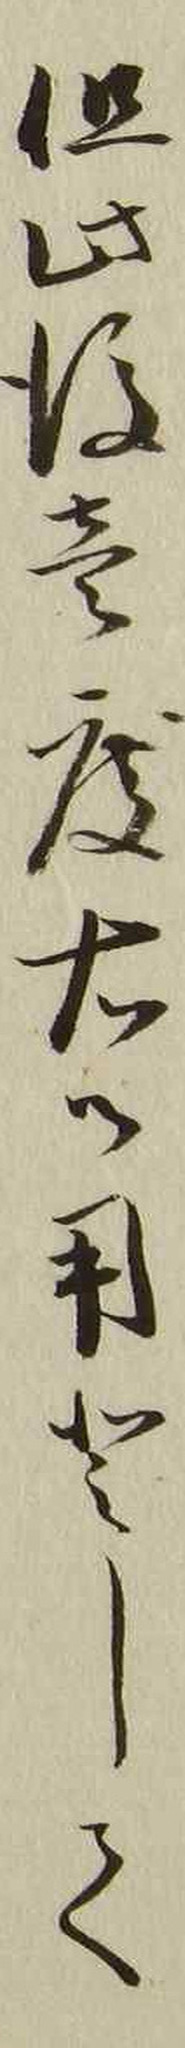但此度壱度右御用として
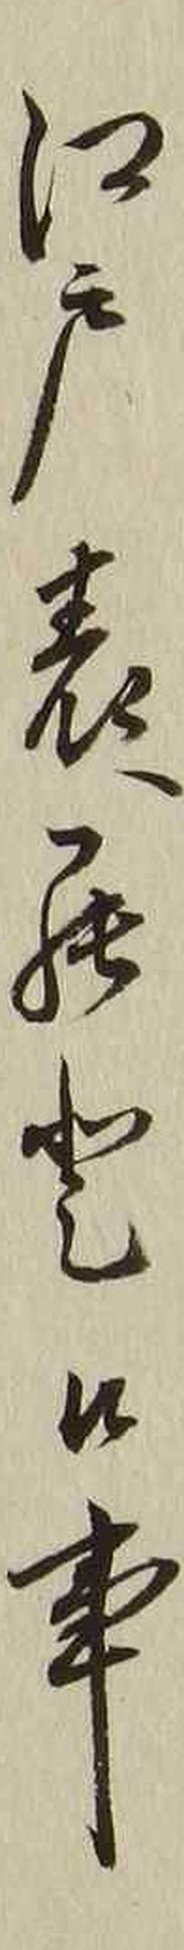江戸表へ罷登候事
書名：諸士系譜　巻之61　と之部4
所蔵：会津若松市立会津図書館
